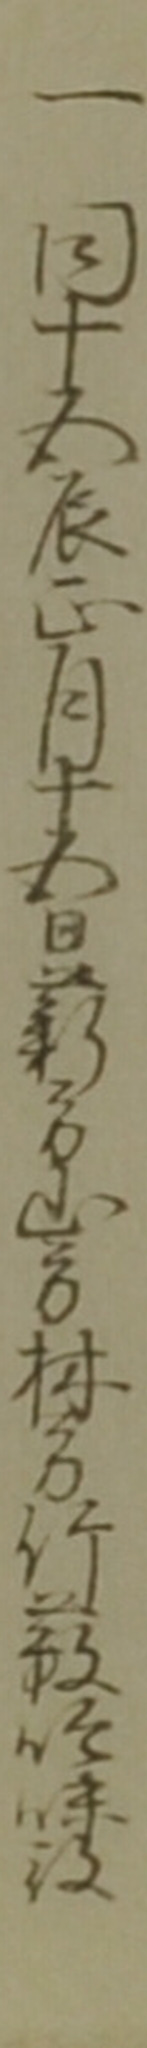一同十五辰正月十五日薪方山方林方竹薮吟味役
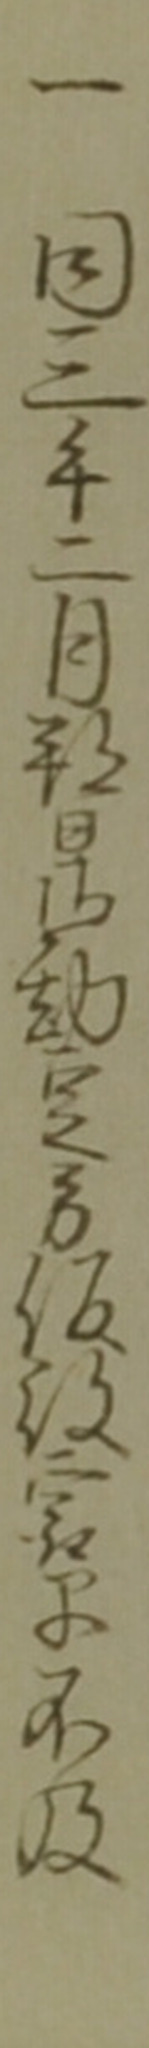一同三午二月朔日御勘定方仮役最早不及
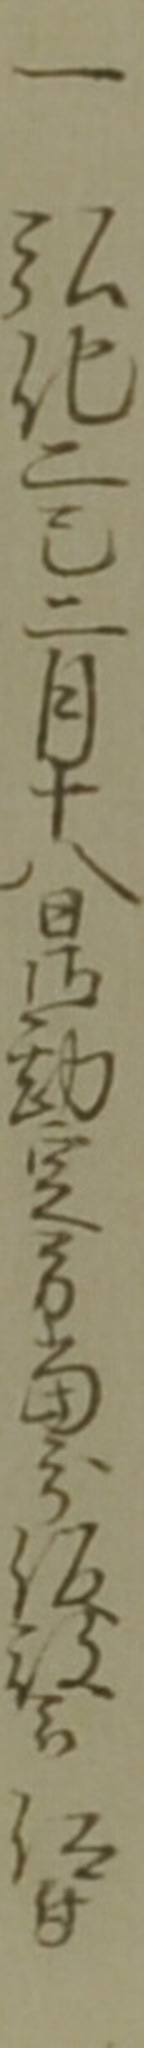一弘化二巳二月十八日御勘定方当分仮役被仰付
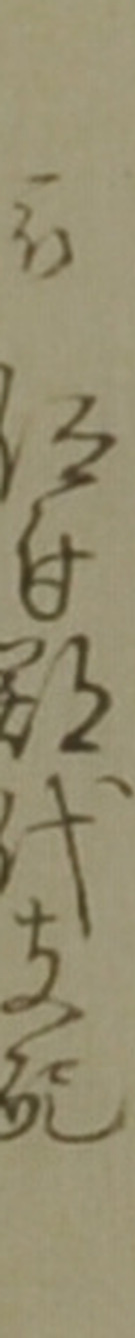被仰付郡代支配
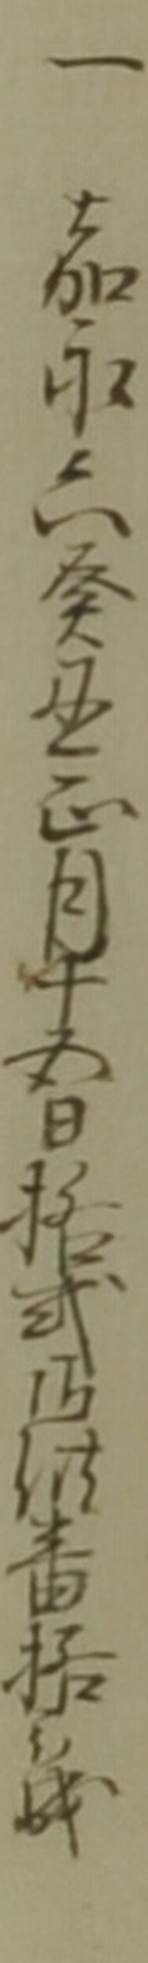一嘉永六癸丑正月十五日格式御供番格被成
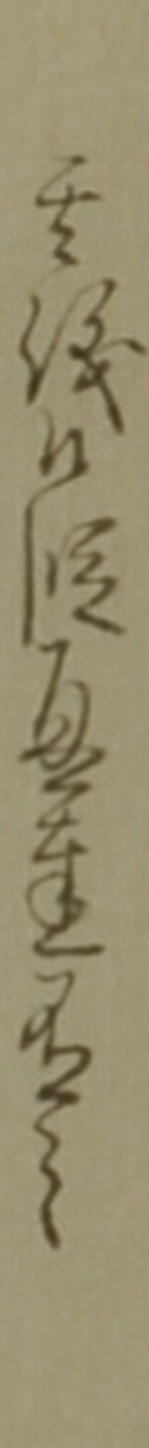其儀候段通達有之
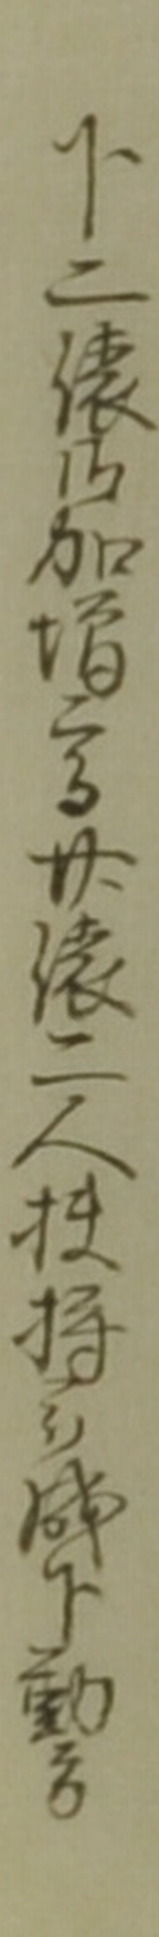下二俵御加増高廿俵二人扶持被成下勤方

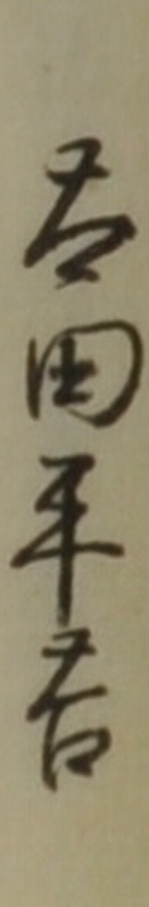太田平吉
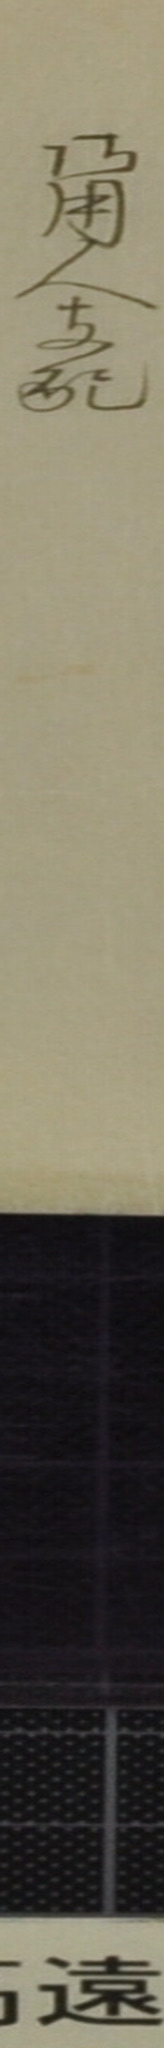御用人支配

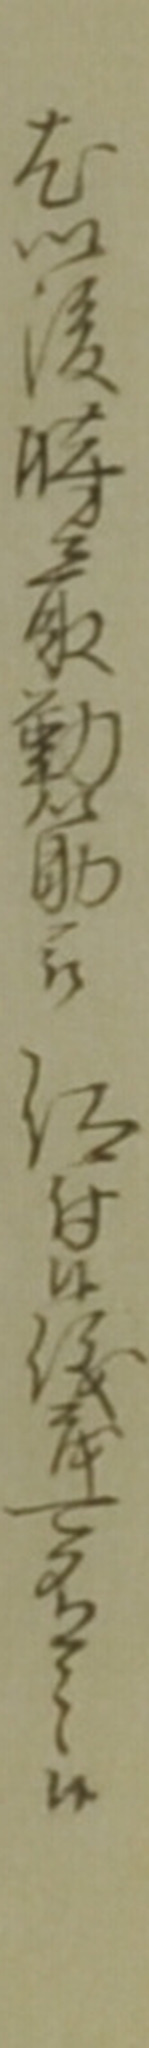尤以後時ニ取勤筋被仰付候儀茂可有之候
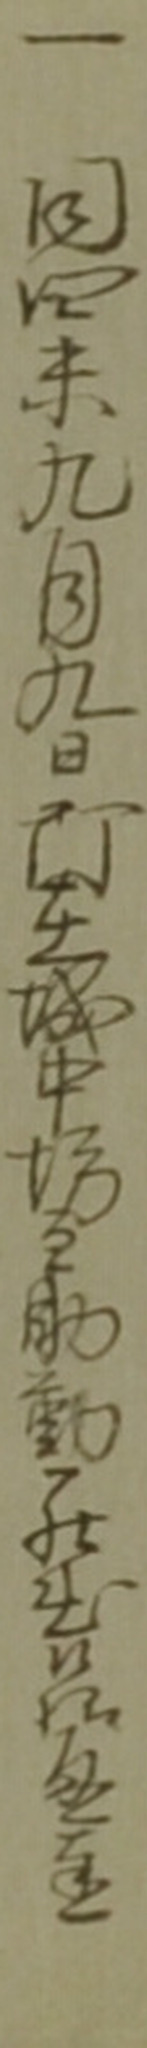一同四未九月九日御在城中坊主助勤罷出候様通達
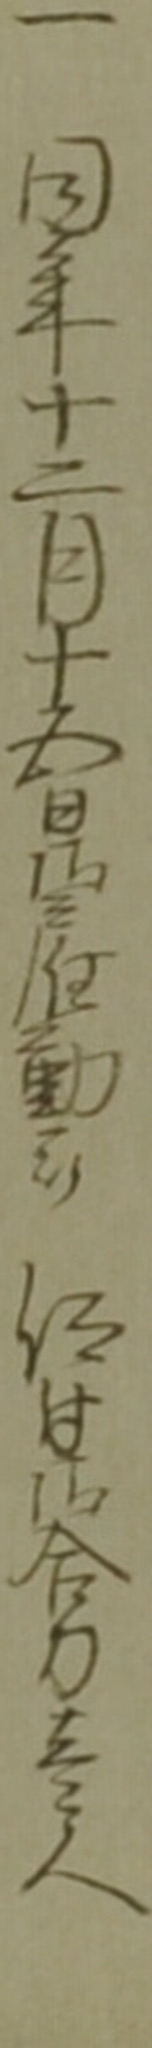一同年十二月十五日御雇勤被仰付御合力壱人

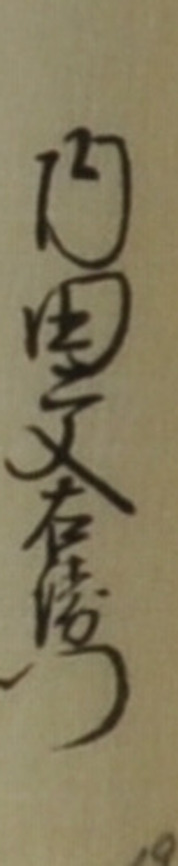内田文右衛門
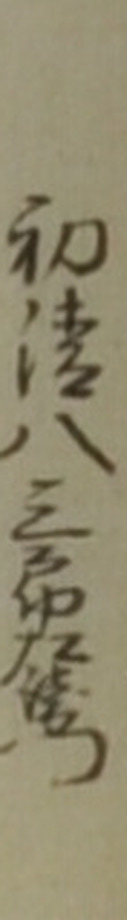初清八三郎左衛門
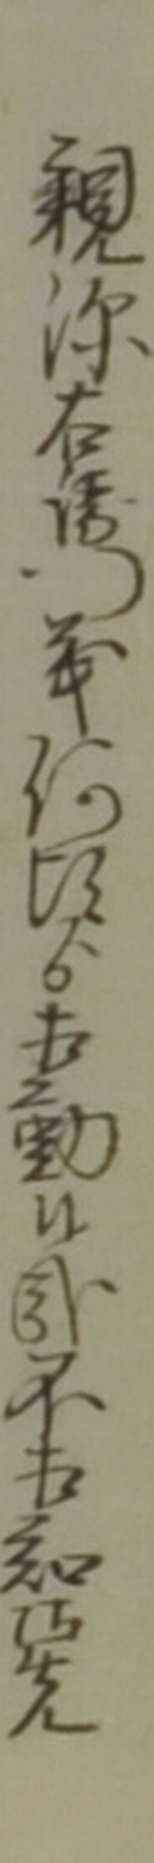親源右衛門義何頃ゟ相勤候哉不相知御先
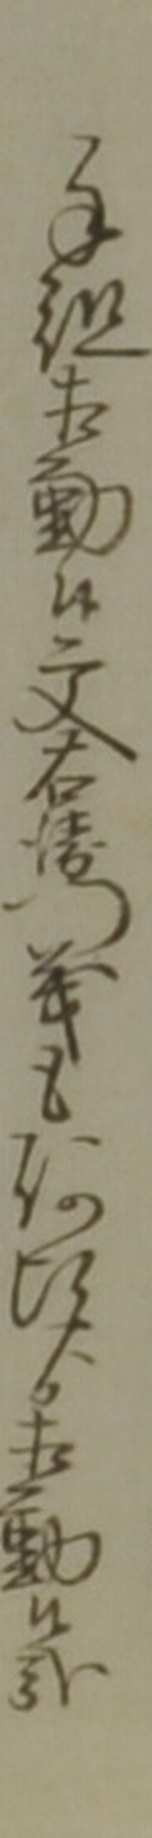手組相勤候文右衛門義も何頃ゟ相勤候哉
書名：無足諸士勤仕録（七）
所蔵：伊那市立高遠町図書館・合同会社AMANE
